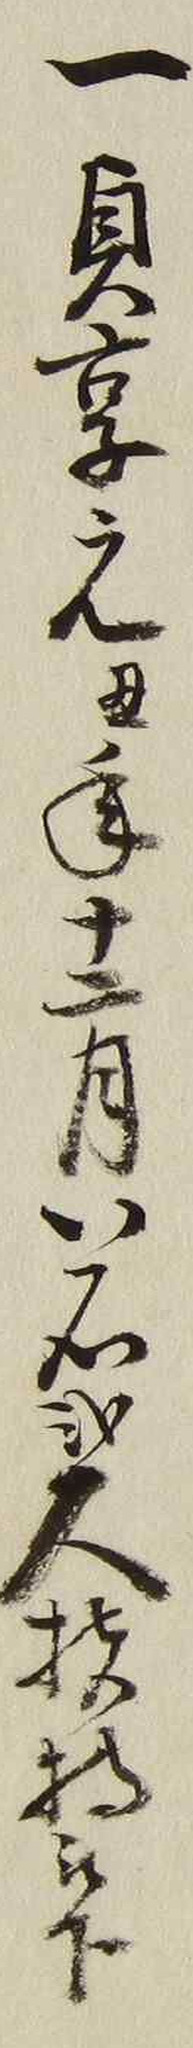一貞享元丑年十二月八石弐人扶持被下
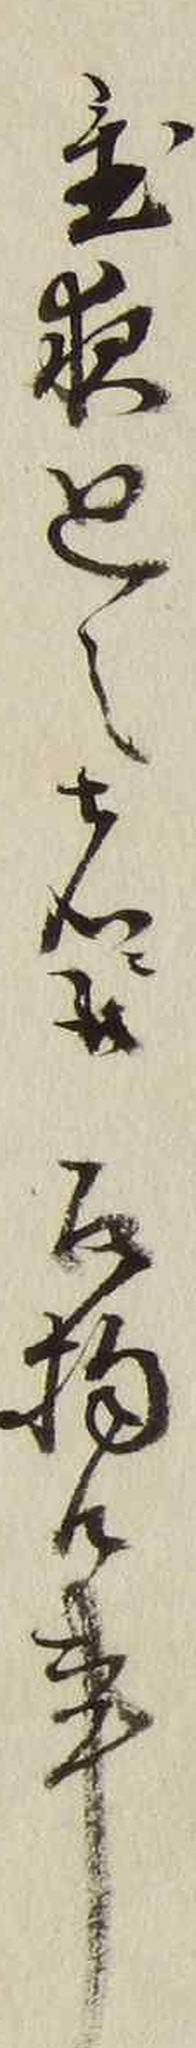置夜廻之者ニ被召抱候事

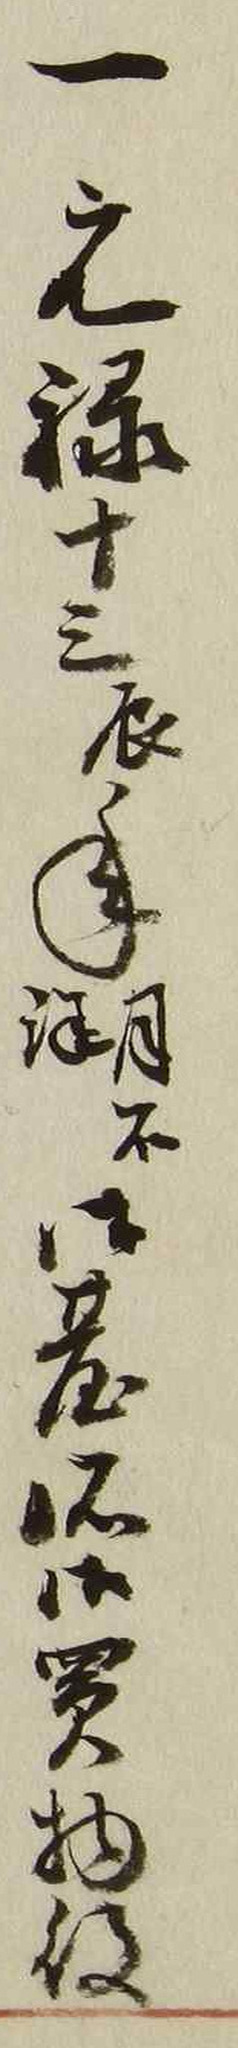一元禄十三辰月不詳御台所御買物役
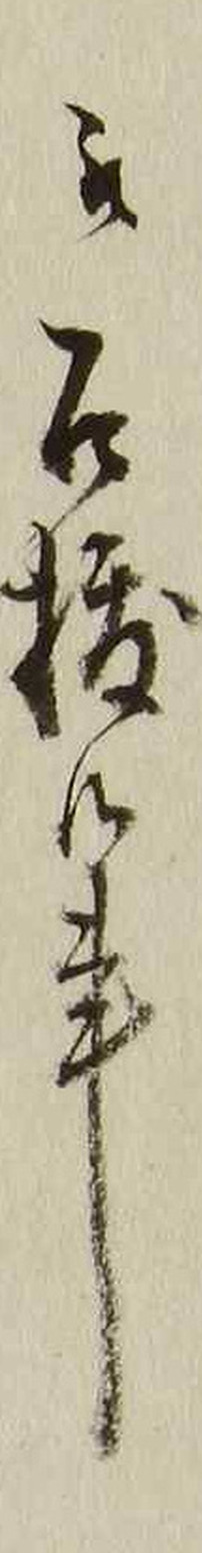被召抜候事
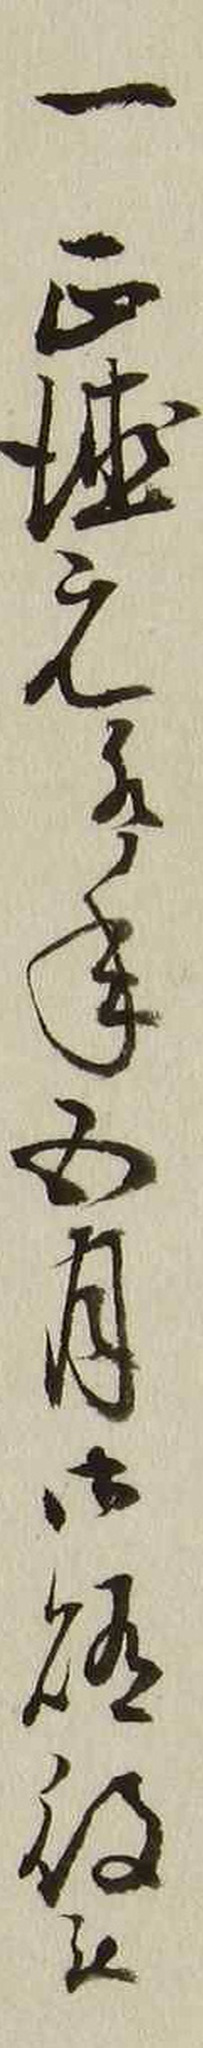一正徳元卯年五月御賄役被
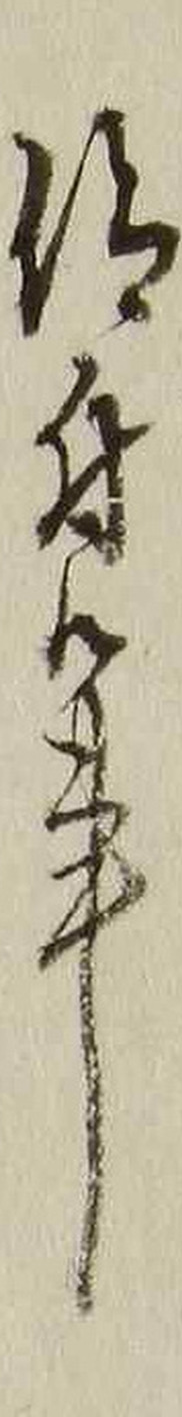仰付候事
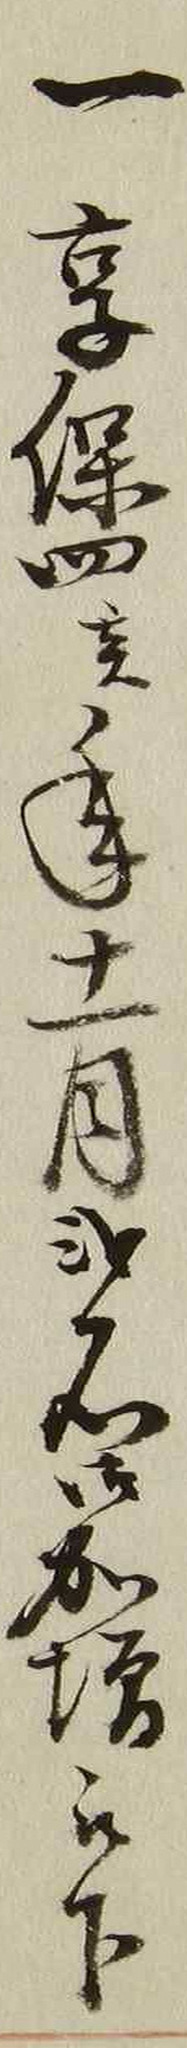一享保四亥年十一月弐名御加増被下
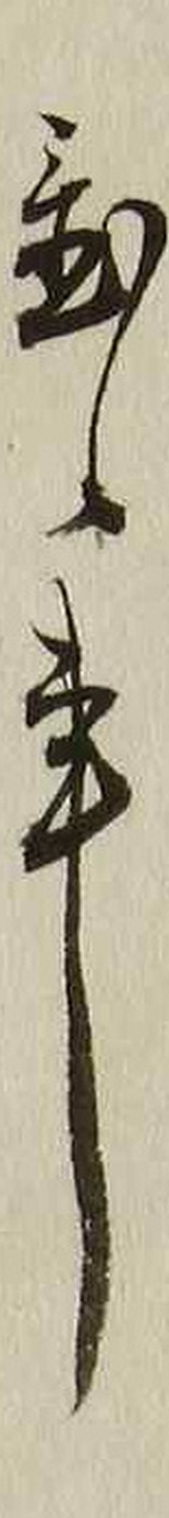置候事
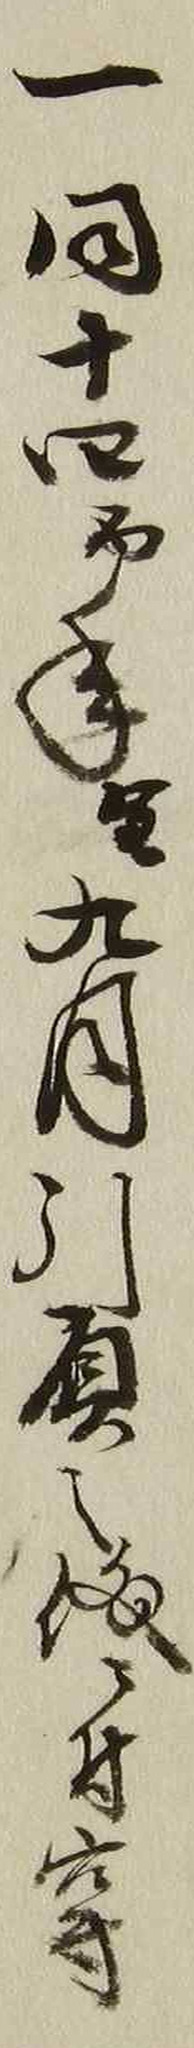一同十四酉年閏九月引負之儀ニ付穿
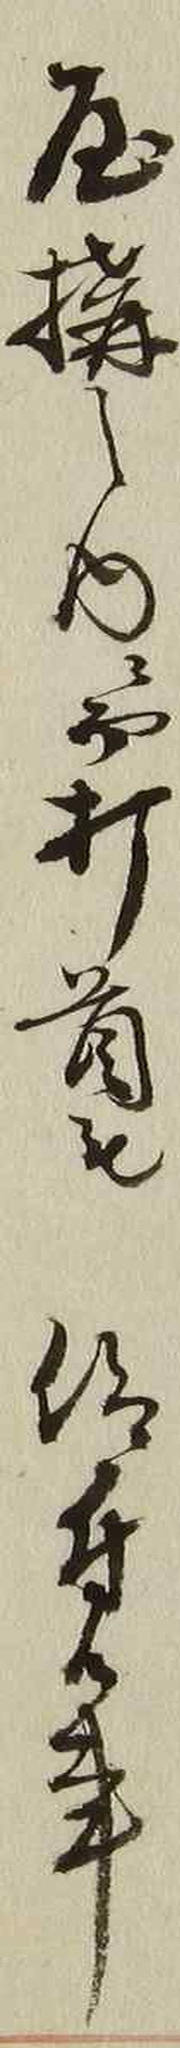屋構之内ニ而打首被仰付候事
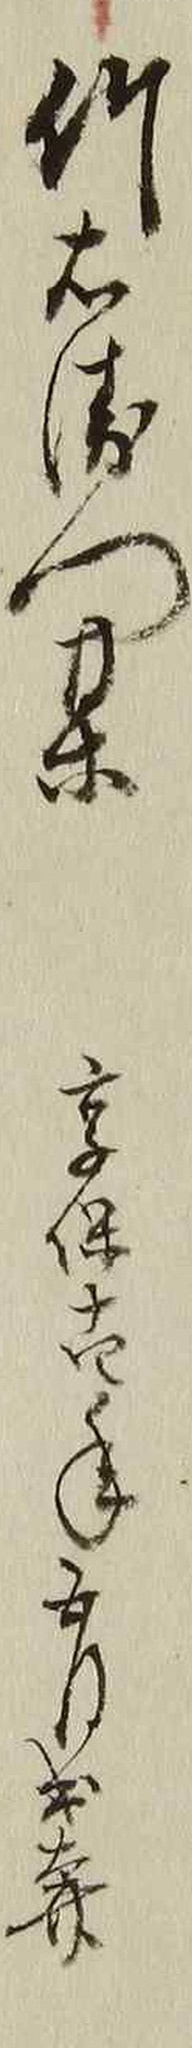竹右衛門某享保十四年五月出奔
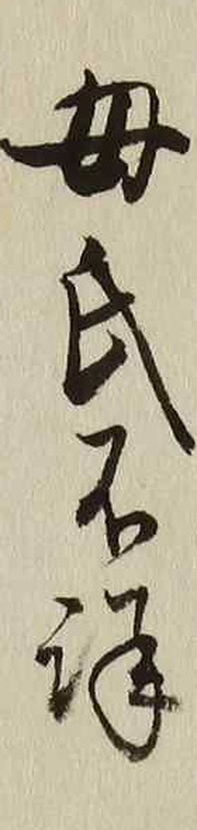母氏不詳
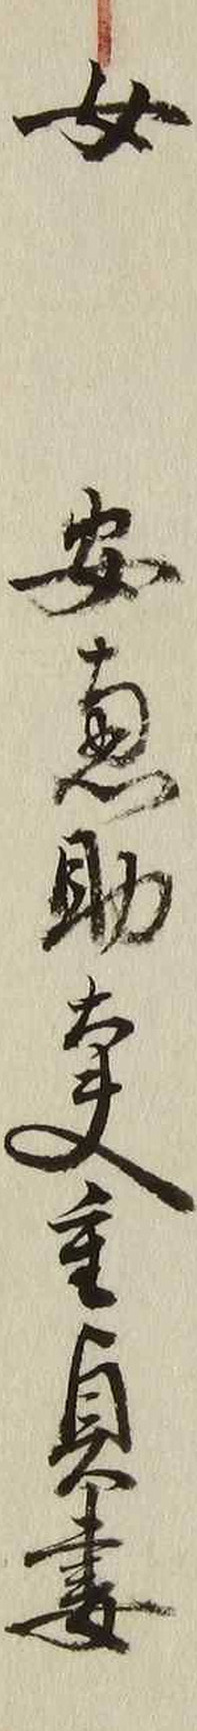女安恵助大夫重貞妻
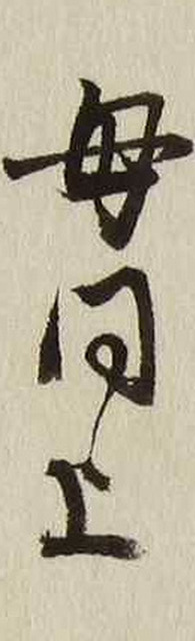母同上
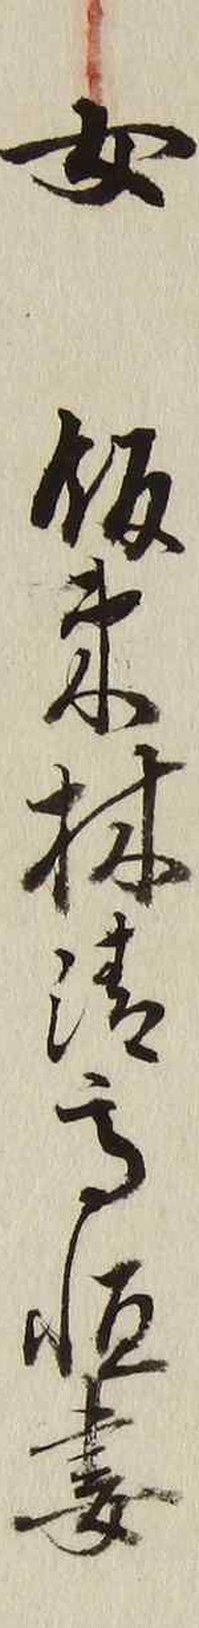女飯束林清高恒妻
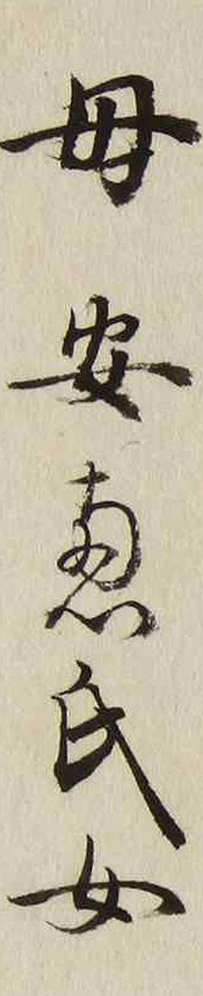母安恵氏女
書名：諸士系譜　巻之36　は之部4
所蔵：会津若松市立会津図書館
